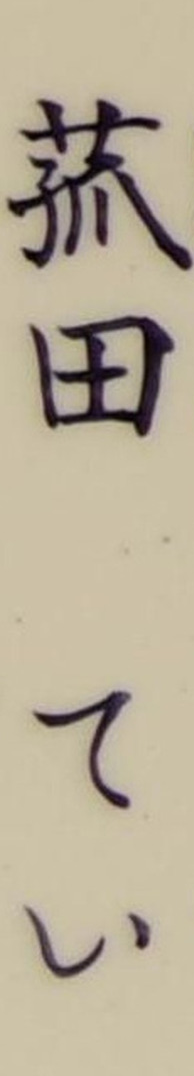菰田てい
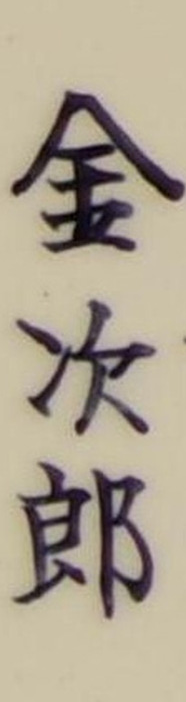金次郎
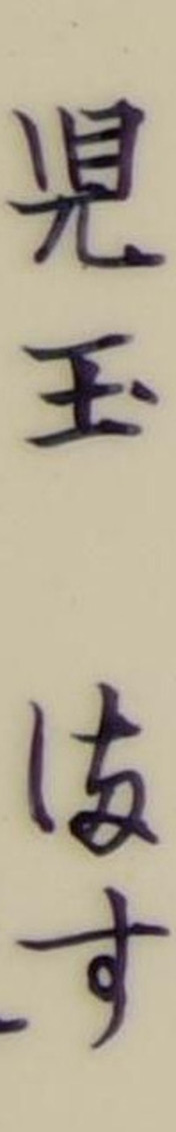児玉ます

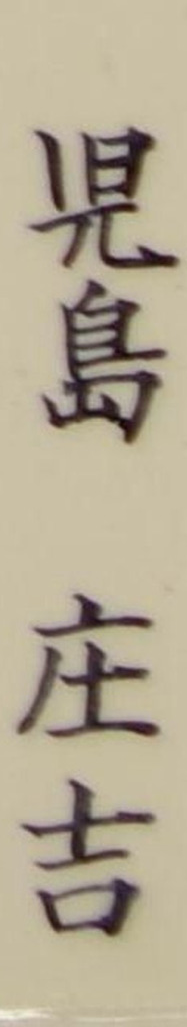児島庄吉
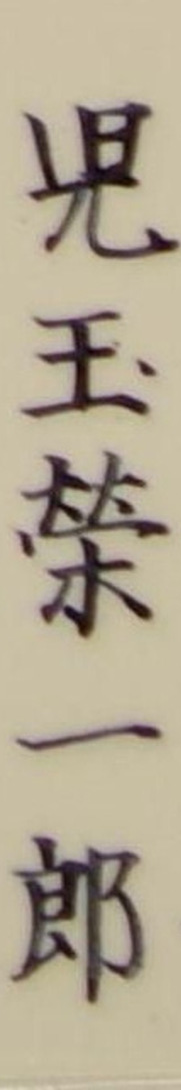児玉榮一郎
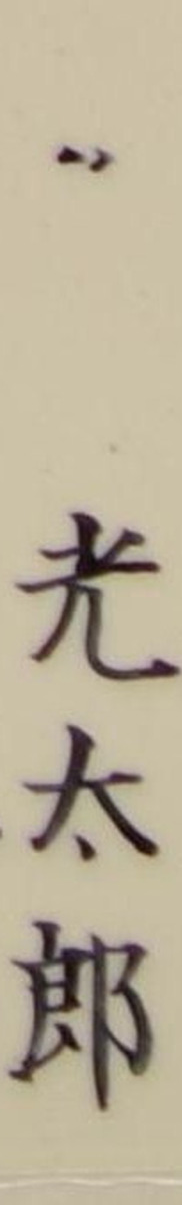光太郎
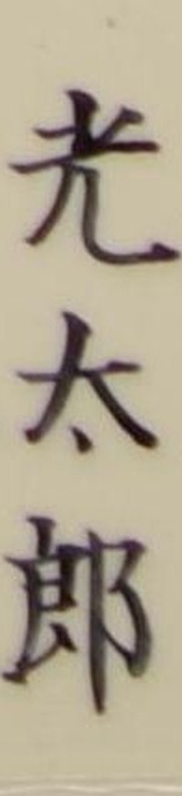光太郎
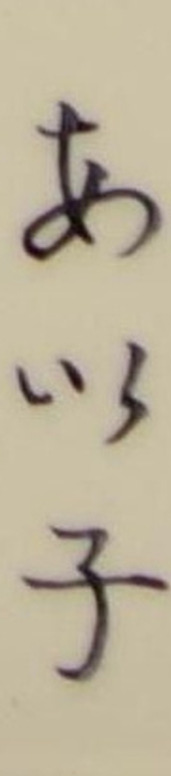あい子
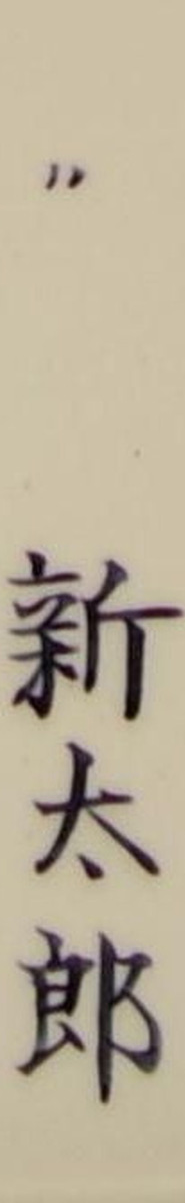新太郎
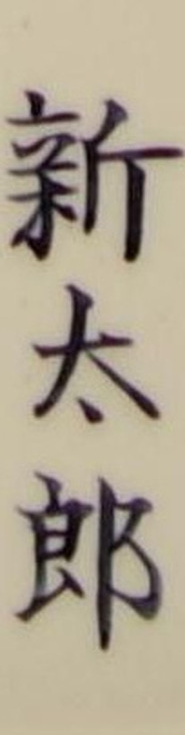新太郎
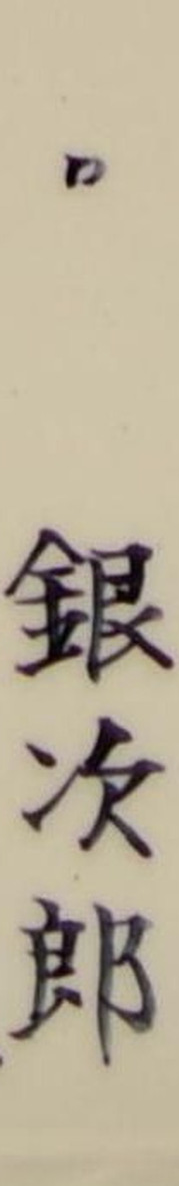銀次郎
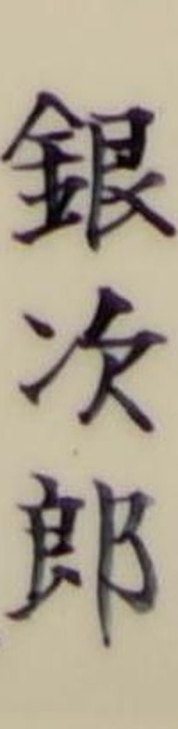銀次郎
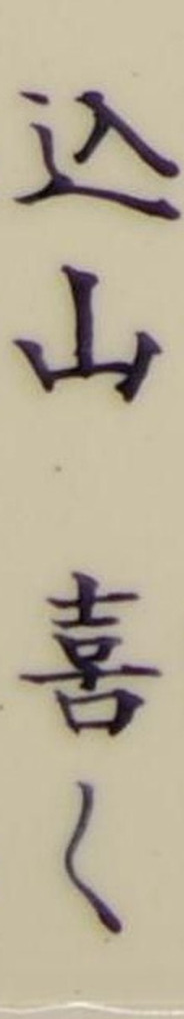込山きく
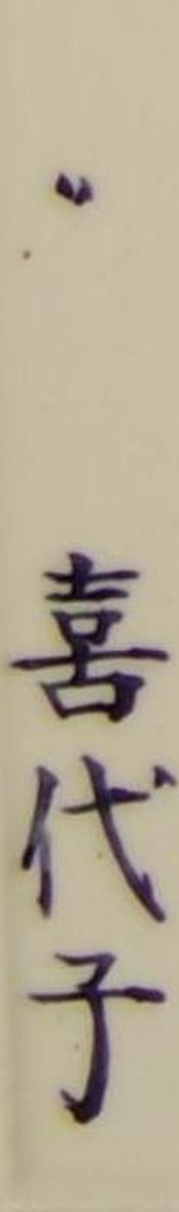喜代子
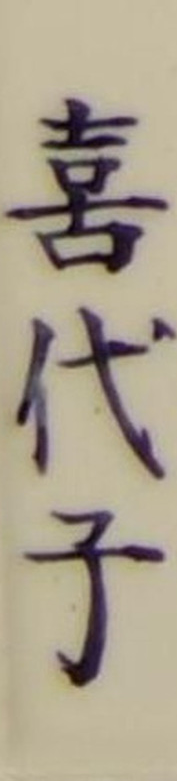喜代子

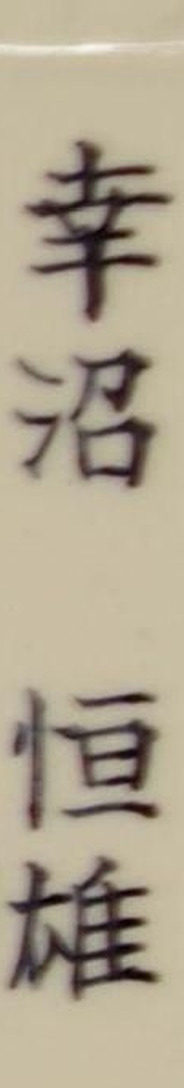幸沼恒雄
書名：E~L
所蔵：高野山金剛峯寺
